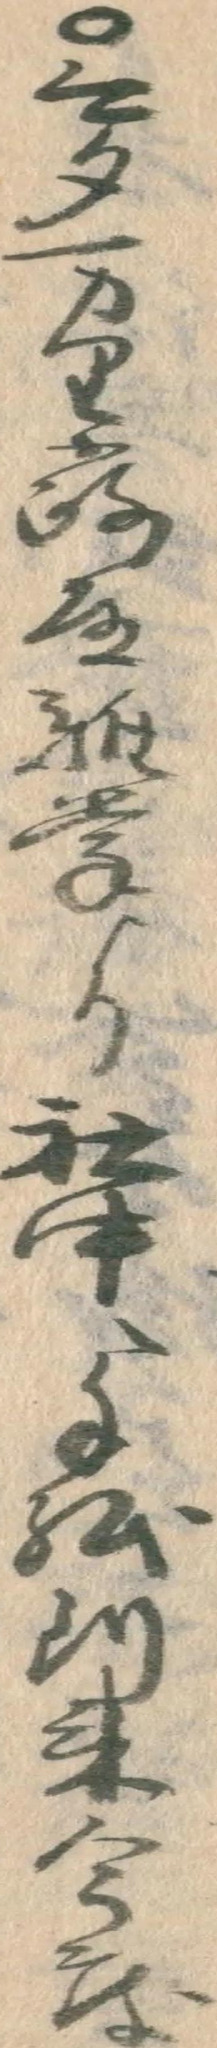○今夕万里小路殿、雑掌より社中へ手紙到来、今度
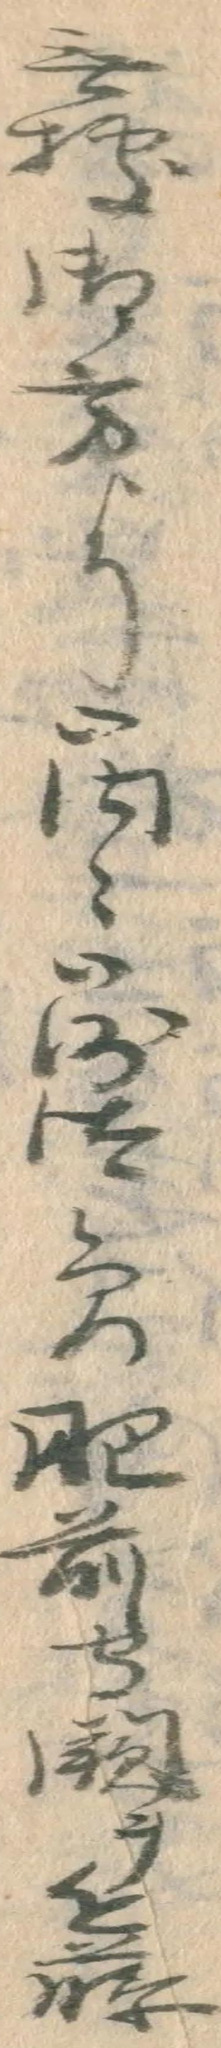無拠御方より御内〻御沙汰候間、肥前守闕ヲ近藤
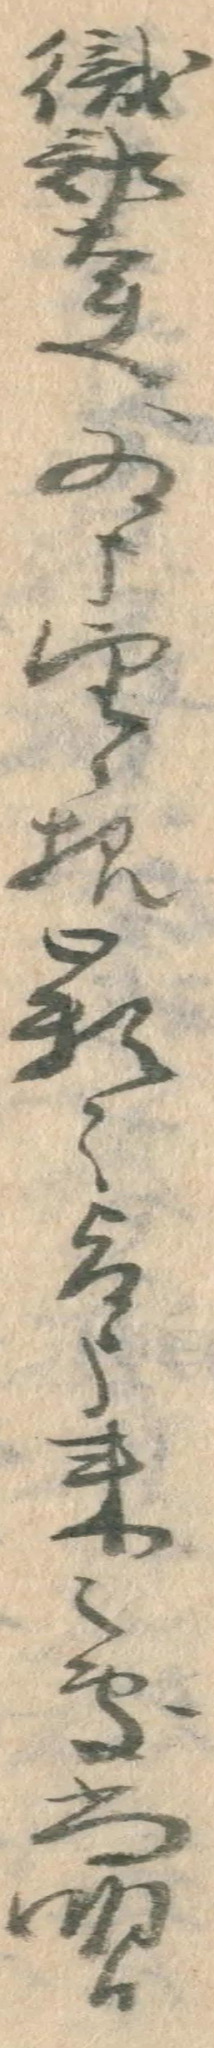織部大夫へ為申望候様御頼之旨申来之處、尚明日
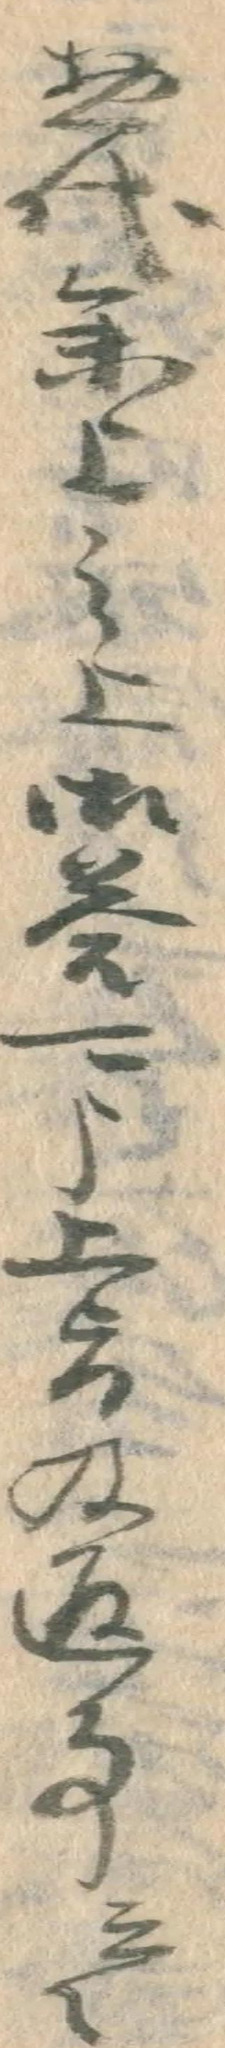惣代参上之上御答可申上旨、及返事云々、
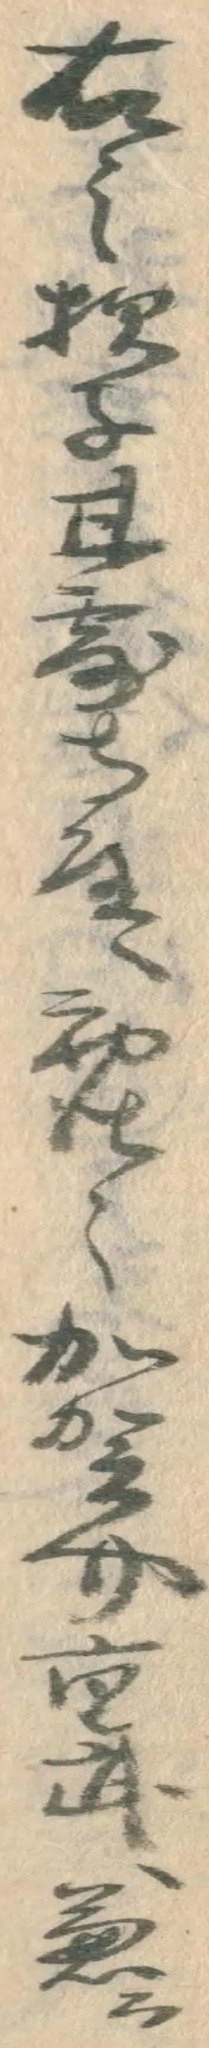右之様子、甘露寺殿へ勤仕之加賀介重武へ兼而

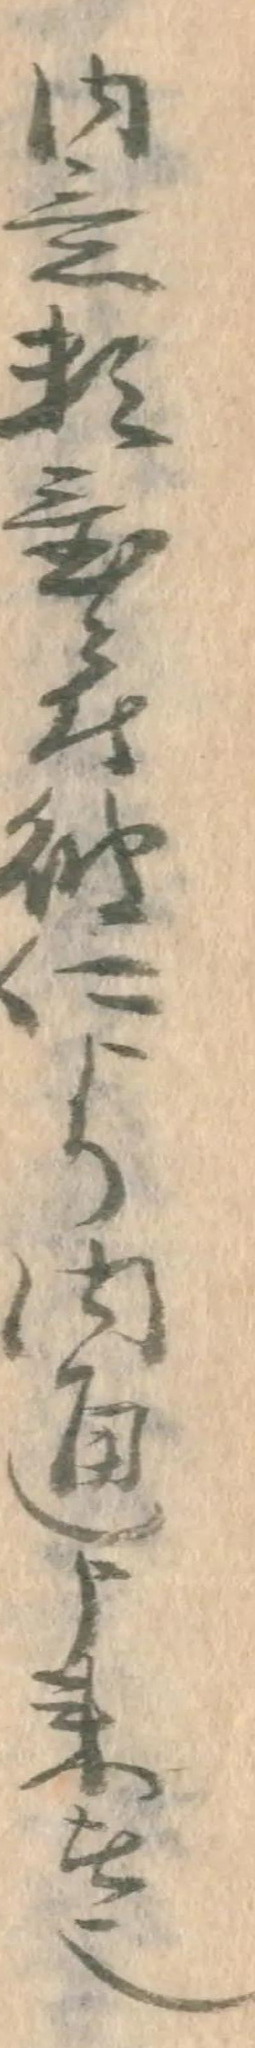内意頼置ニ付、彼仁より内通申来無也、
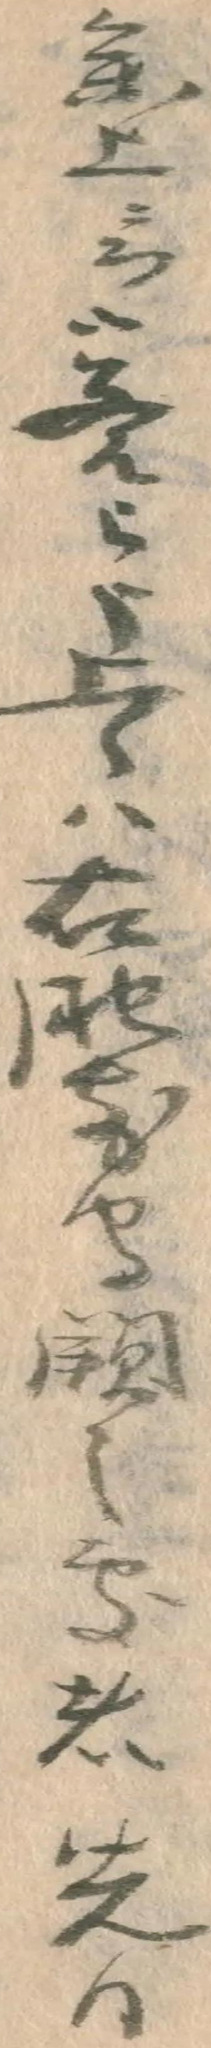参上ニ而御答被申上候ハ、右肥前守闕之處者、先日
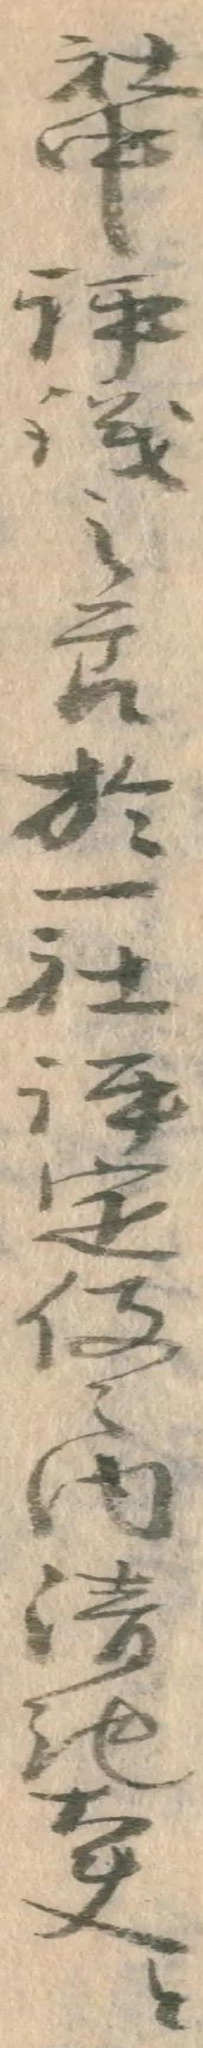社中評議之節、於一社評定役之内清純大夫と
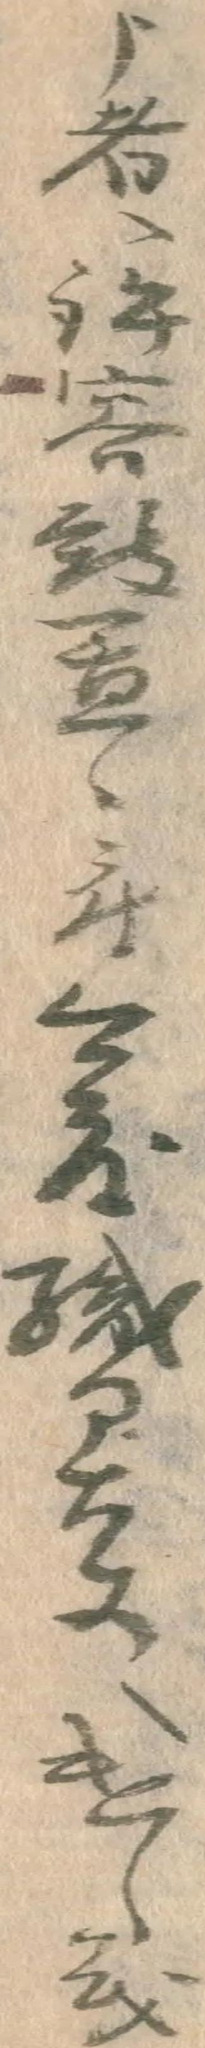申者へ許容致置候ニ付、今度織部大夫へ遣し義
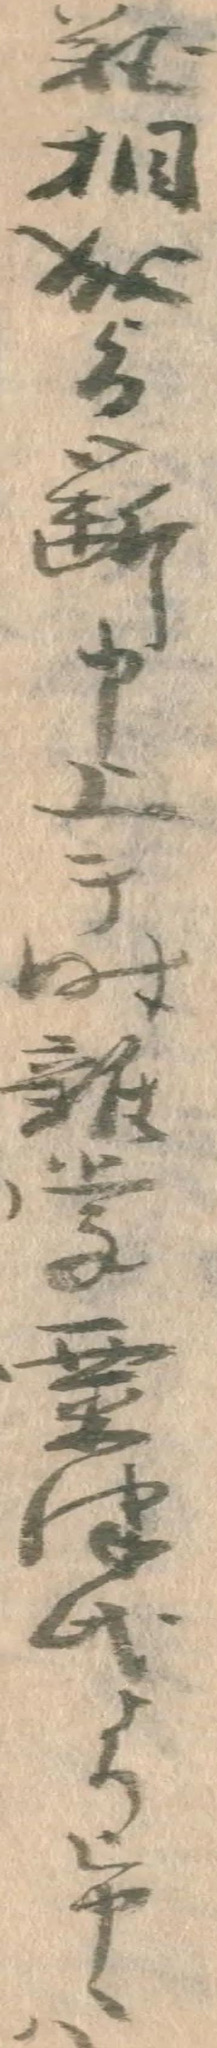難相成旨御断申上、于時雑掌粟津氏より被申候ハ、
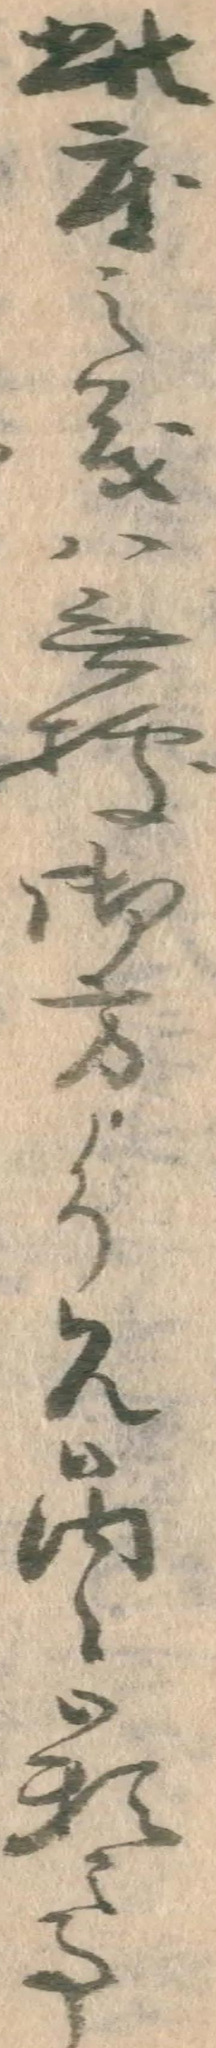此度之義は無拠御方より先日内々御頼之事
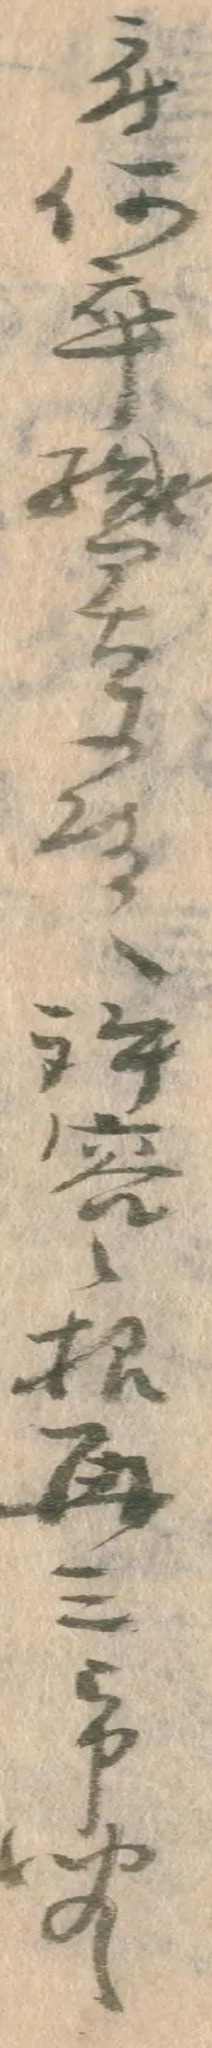ニ付、何卒職部大夫殿ヘ許容之様、再三被申聞候
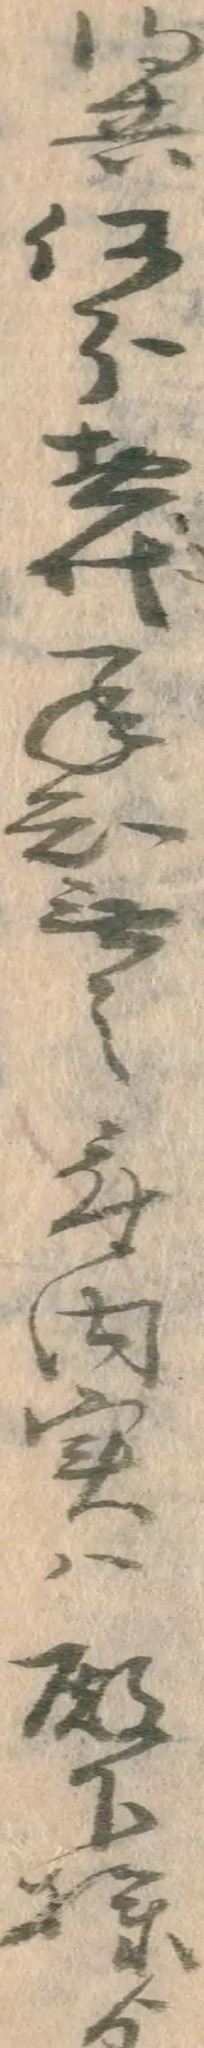得共、何分惣代承知無ニ付、内実ハ殿下様ゟ
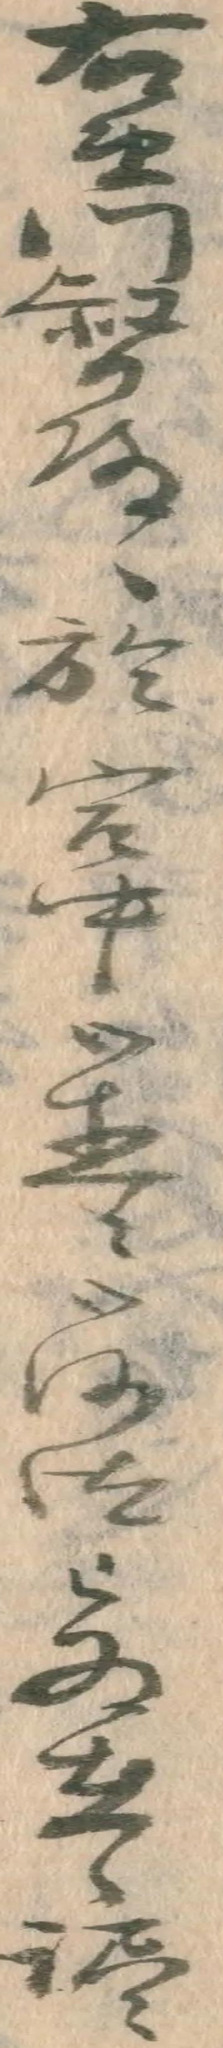右衛門督殿へ於宮中御直ニ御沙汰被為在候評
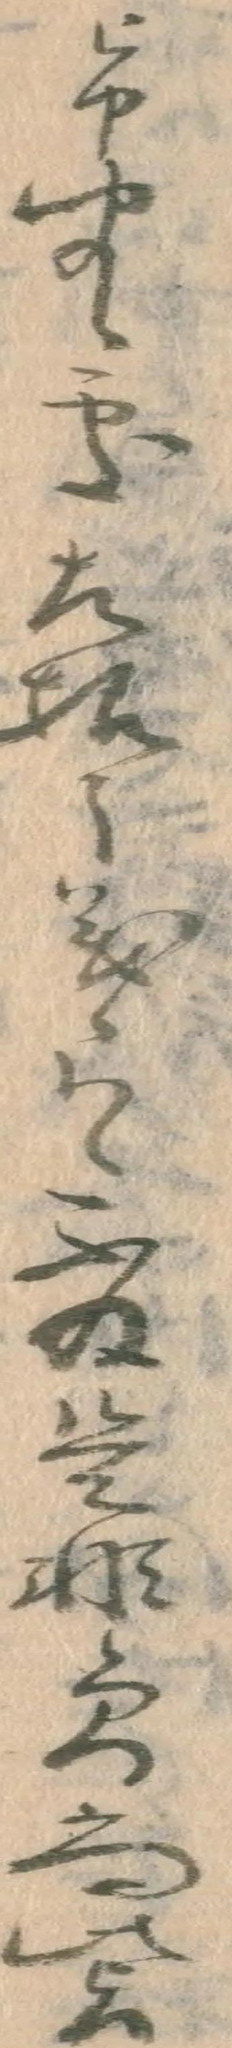被申聞候處、左様之義候ハゝ、不及是非候間、尚此旨
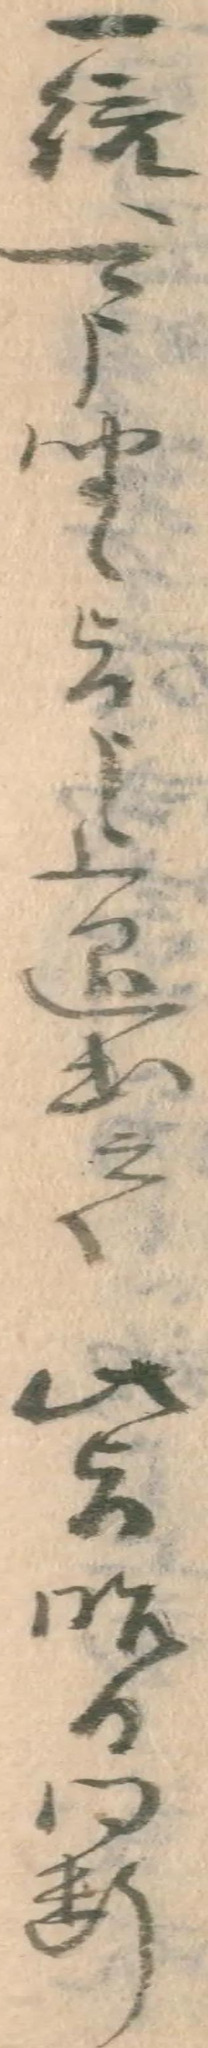一統ヘ可申聞候旨申上退出云々、此旨昨日同断
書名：賀茂社記録. 第63冊
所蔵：国立国会図書館 National Diet Library, JAPAN
